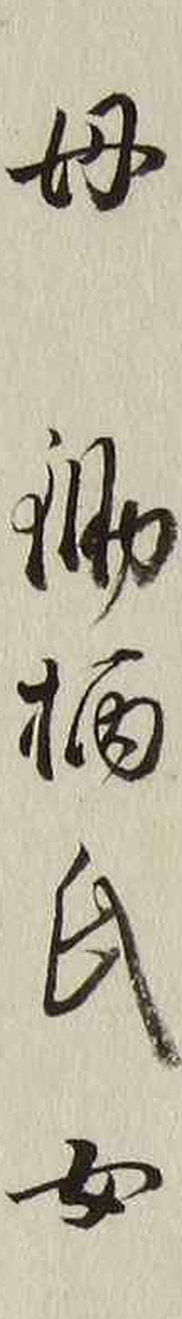母鋤柄氏女
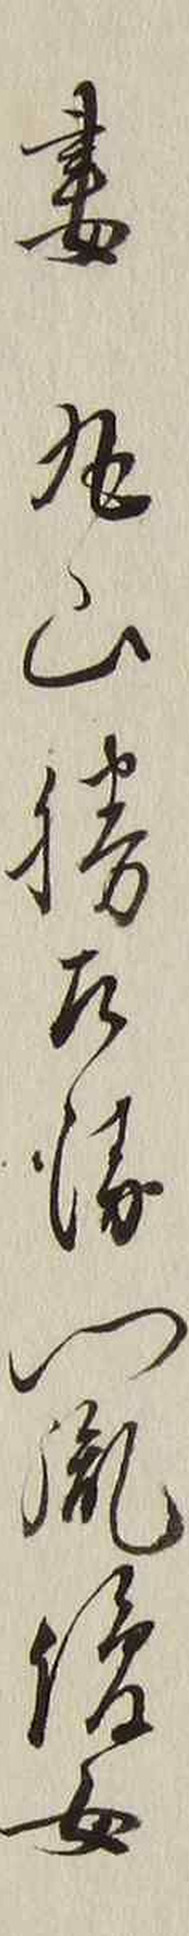妻丸山勝左衛門胤俊女
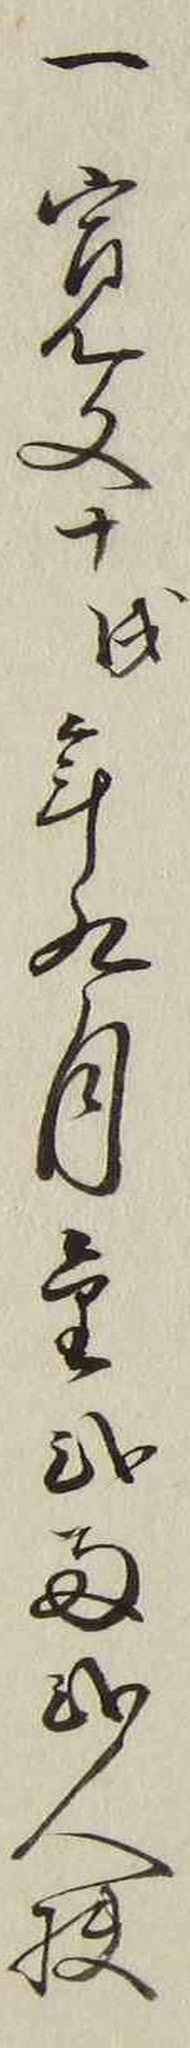一寛文十戌年九月金弐両弐人扶

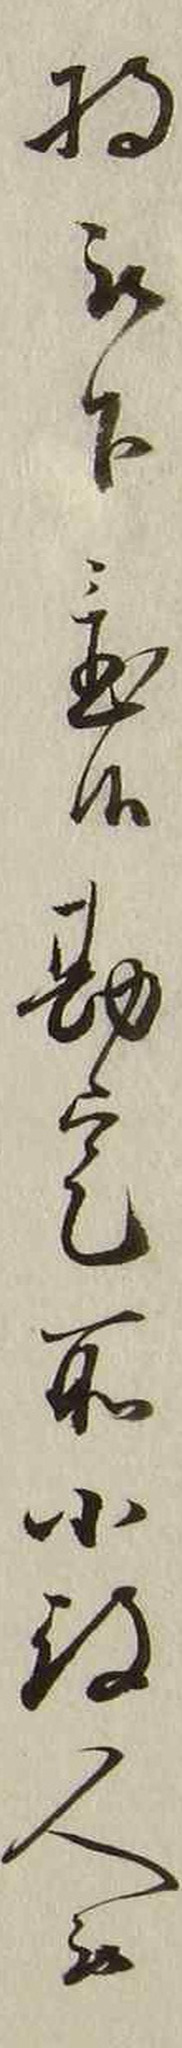持被下置候勘定所小役人被
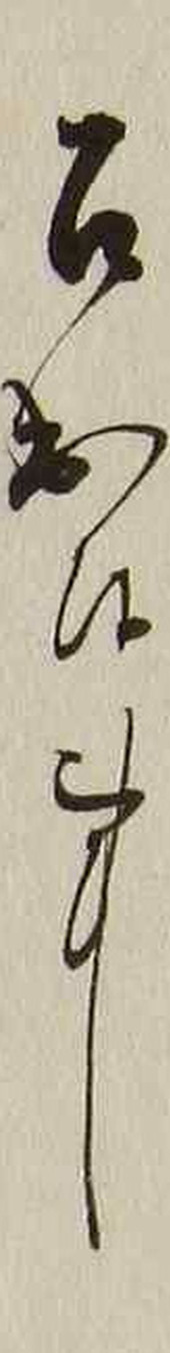召出候事
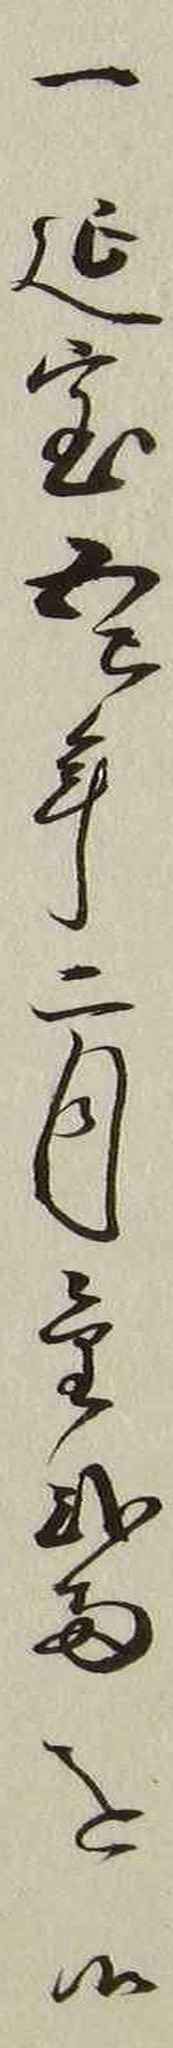一延宝五巳年二月金弐両を御
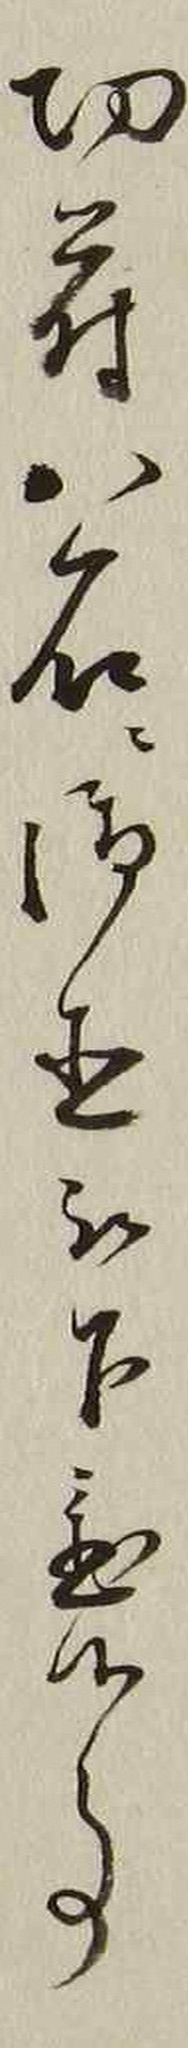切符八石に御直被下置候事
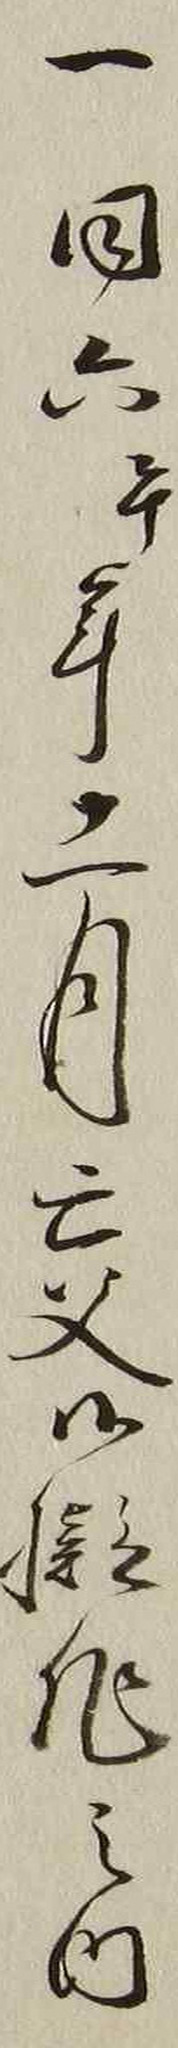一同六午年十一月亡父御擬作之内
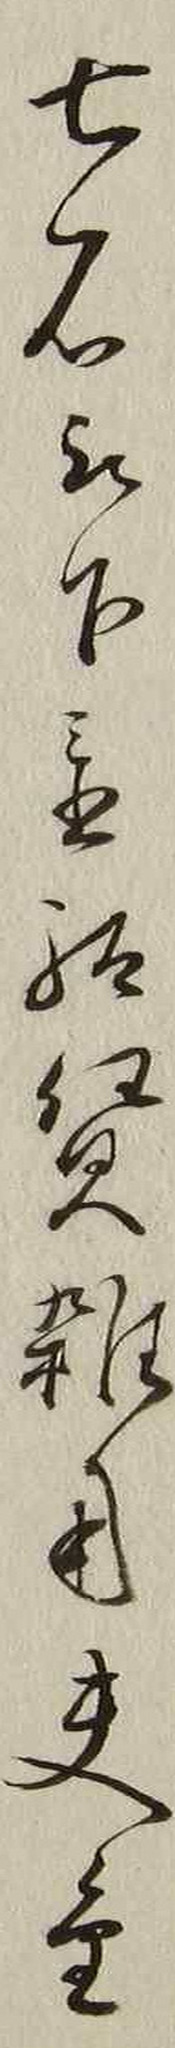七石被下置駄賃雑用夫金
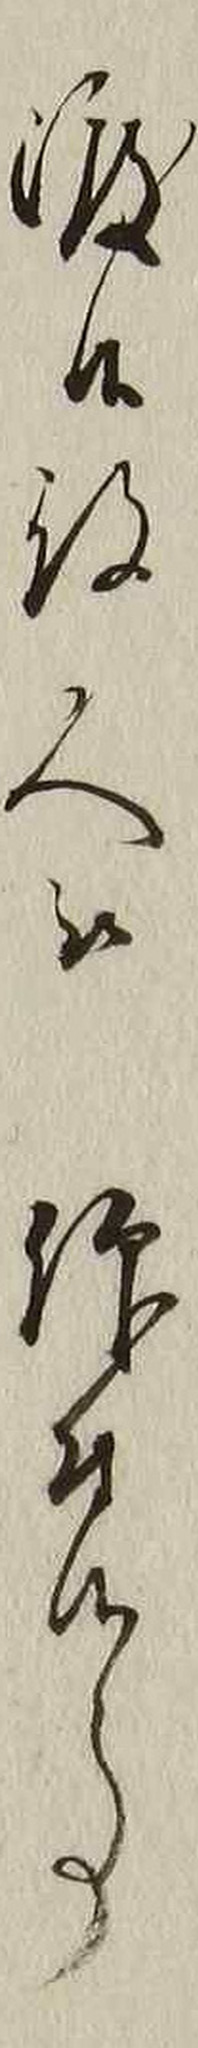渡候役人被仰付候事
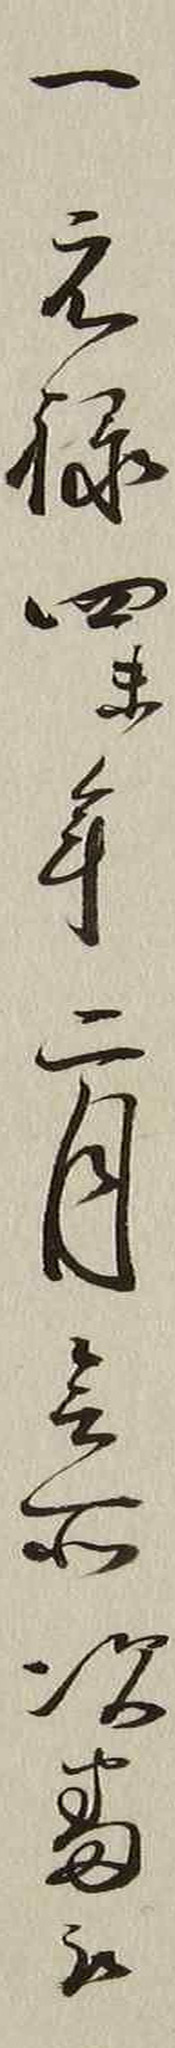一元禄四未年二月会所次番被
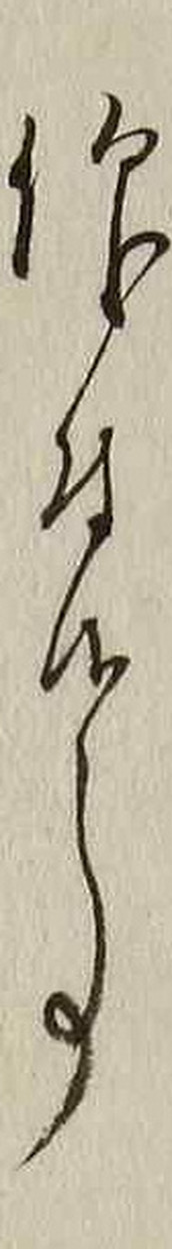仰付候事
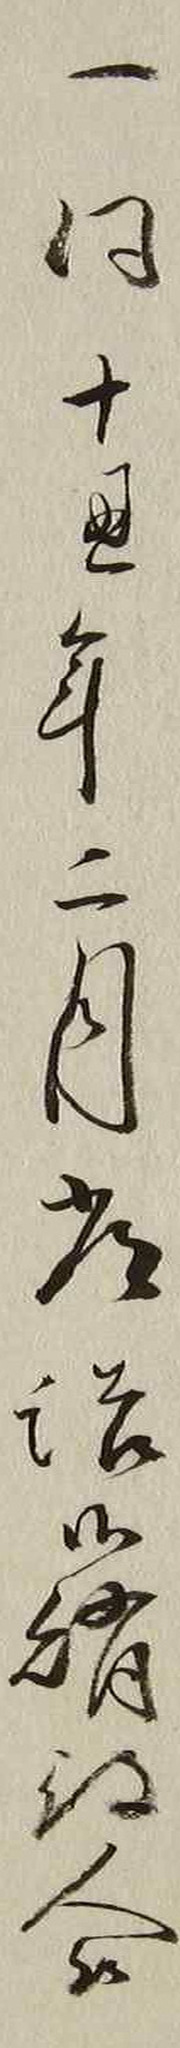一同十丑年二月常詰御賄役人被
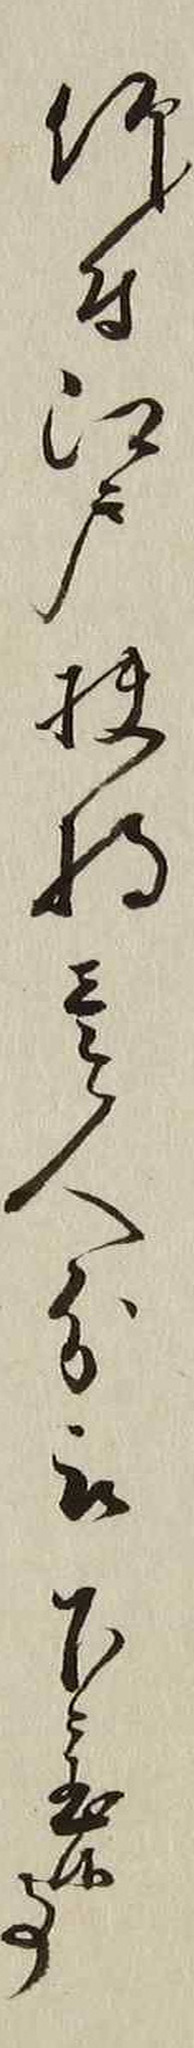仰付江戸扶持壱人分被下置候事
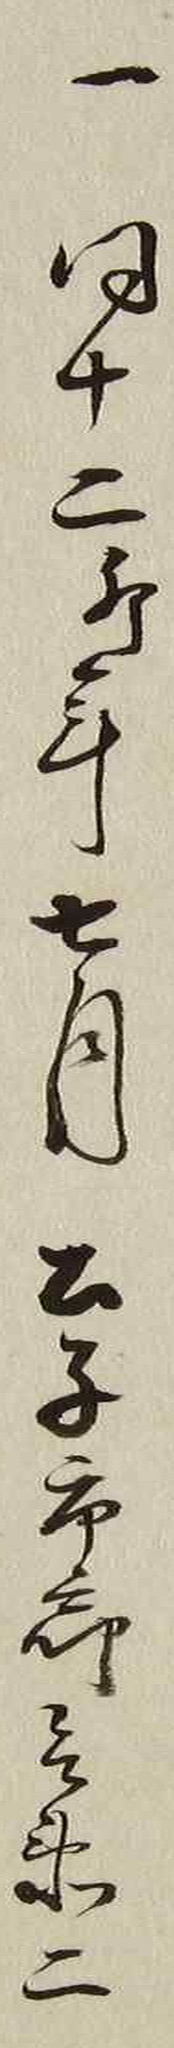一同十二卯年七月公子市郎兵衛二
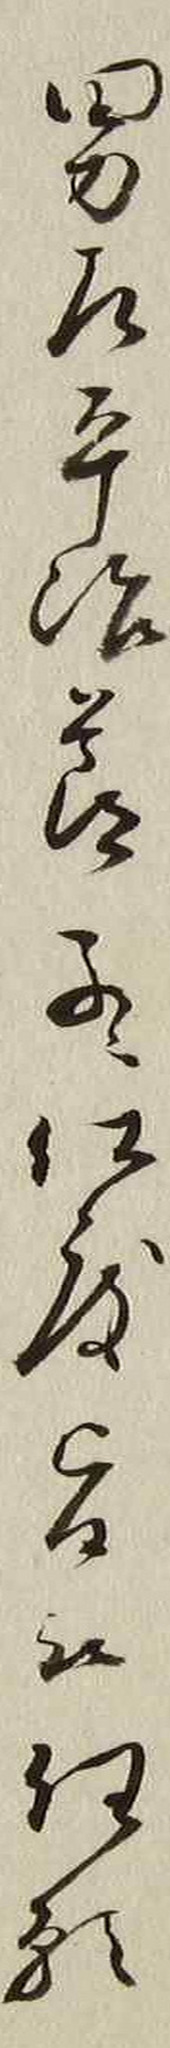男左平治養子に仕度旨被任願
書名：諸士系譜　巻之158　ね之部2
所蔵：会津若松市立会津図書館
